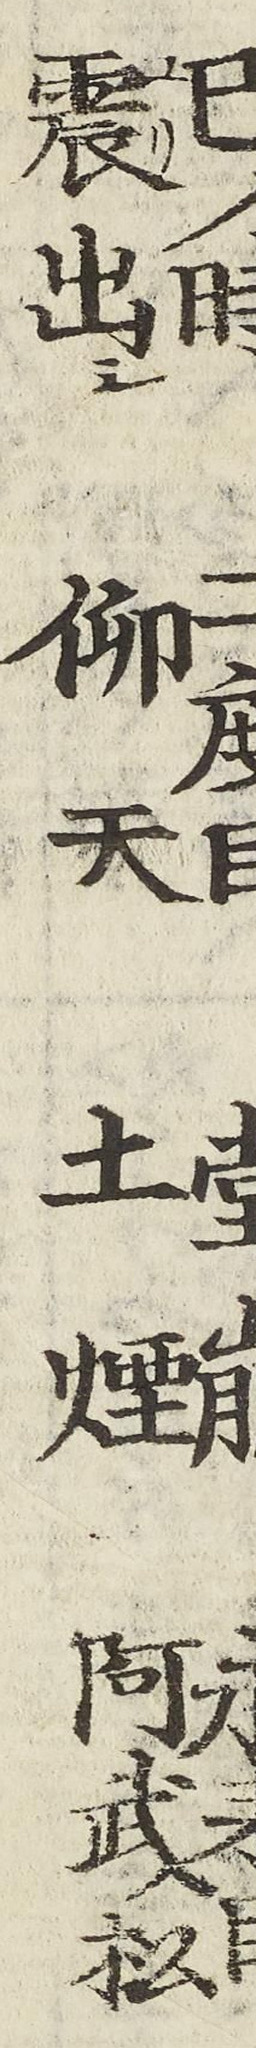震出シ仰天土煙阿武松
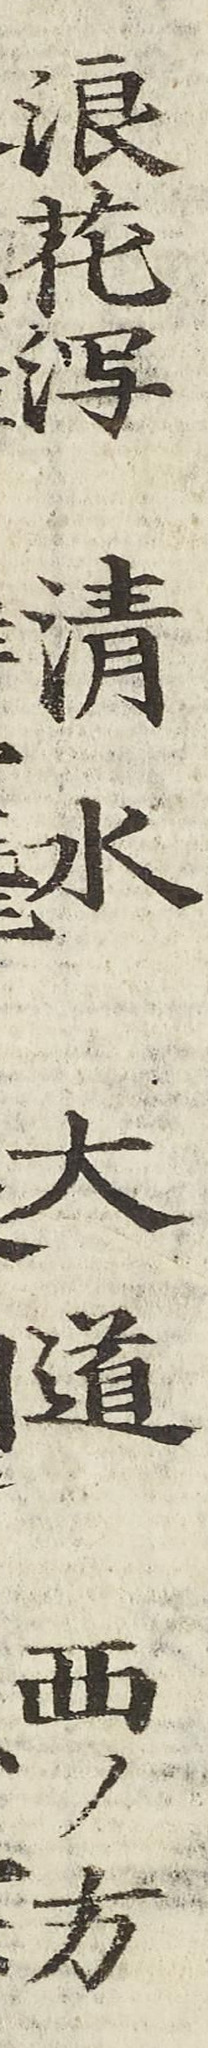浪花潟清水大道西ノ方
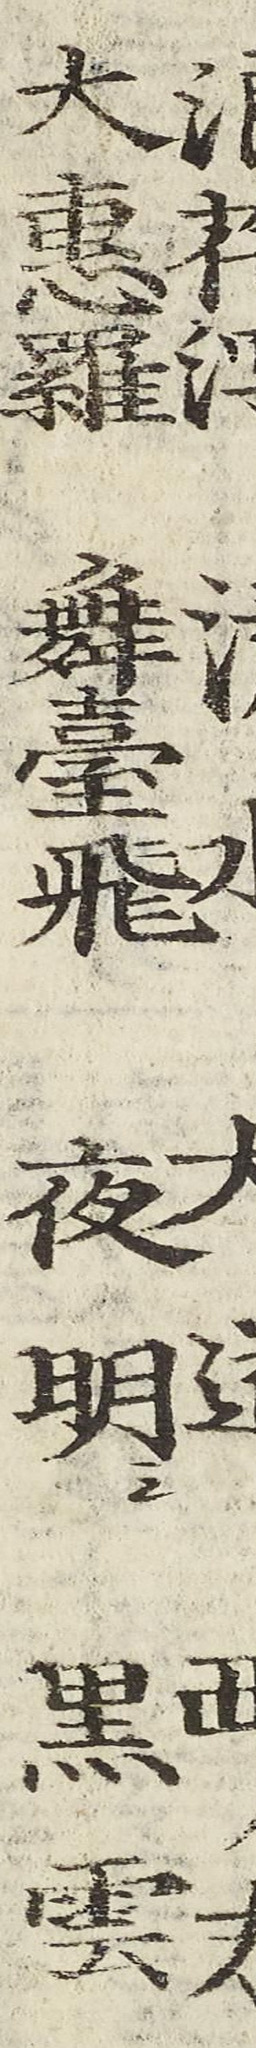大恵羅舞台飛夜明シ黒雲
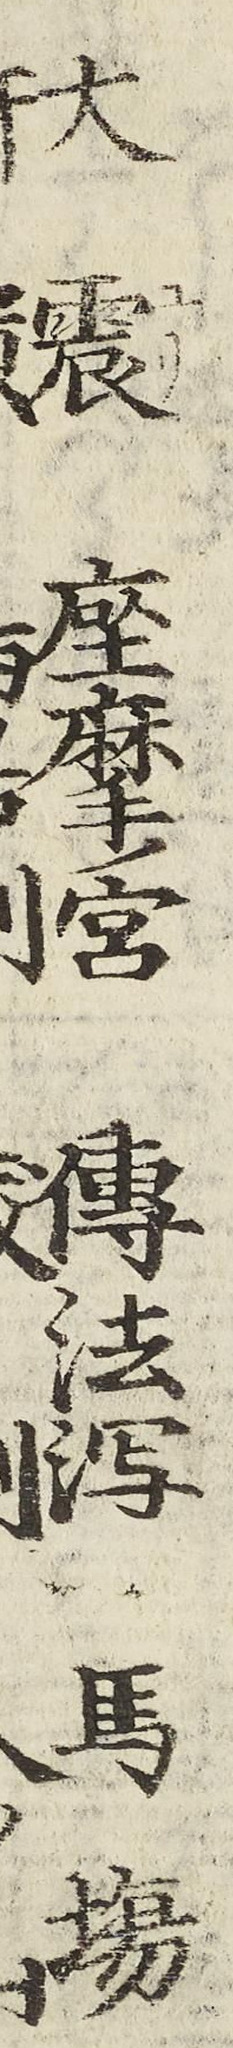大震座摩ノ宮伝法潟馬場
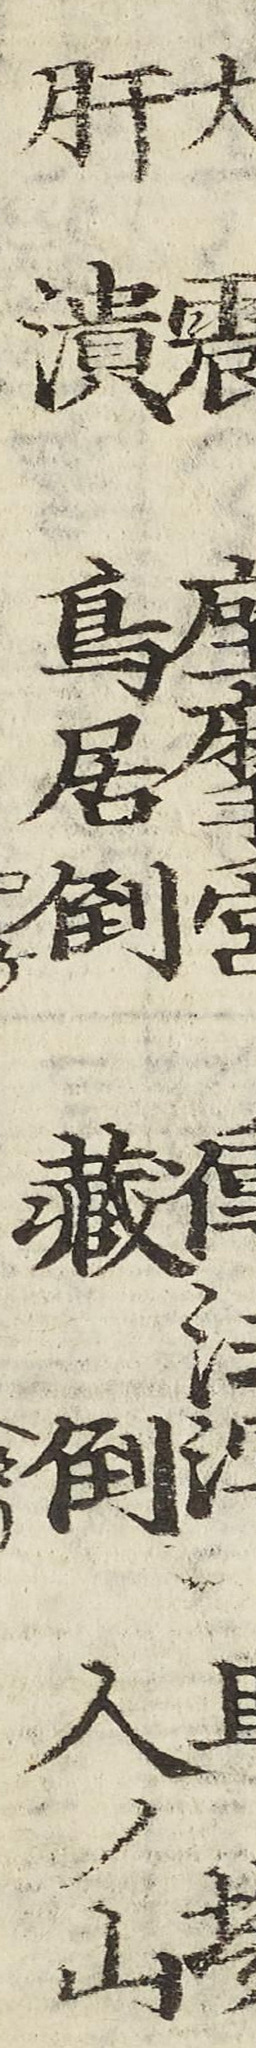肝潰鳥居倒蔵倒人ノ山
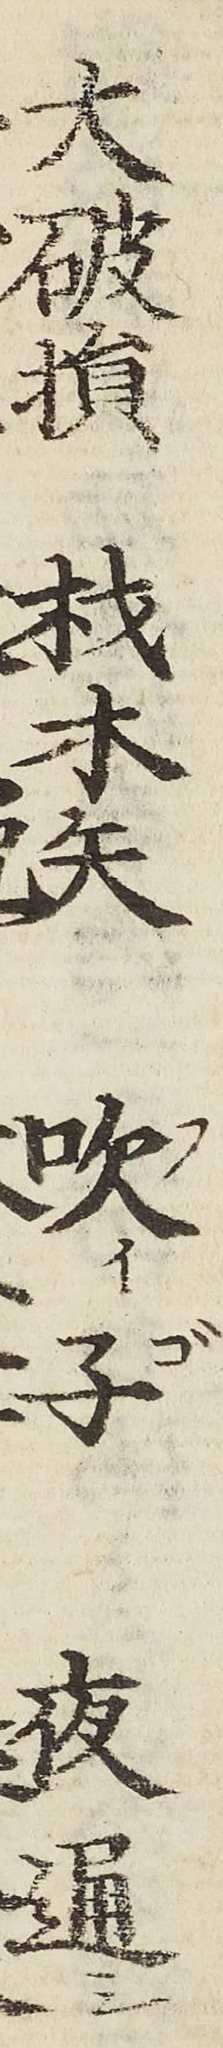大破損材木矢吹イ子夜通シ
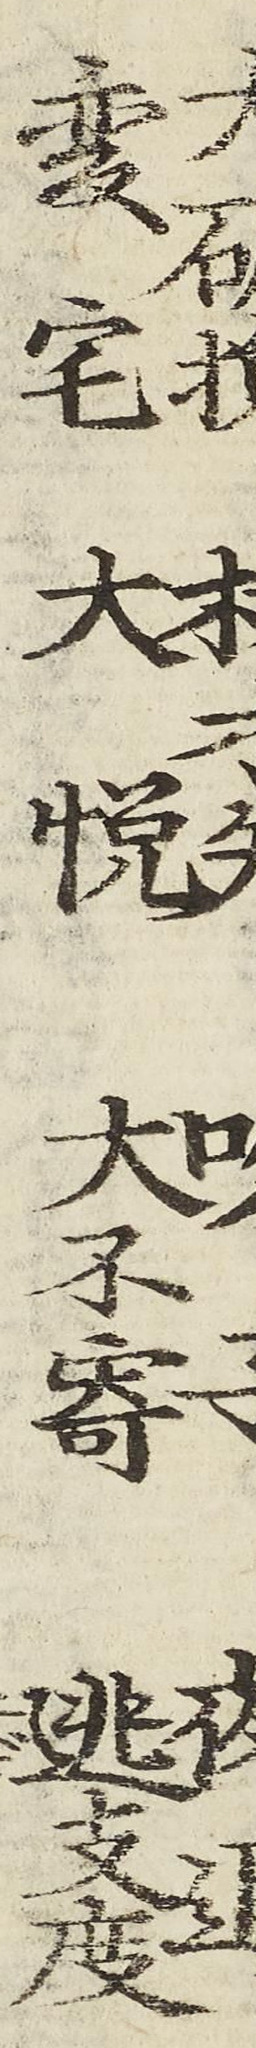変宅大悦大不寄逃支度
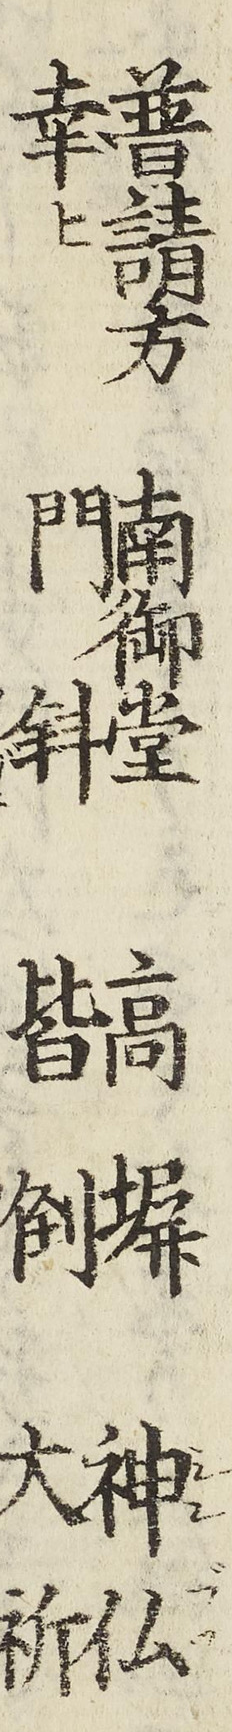普請方南御堂高塀神仏
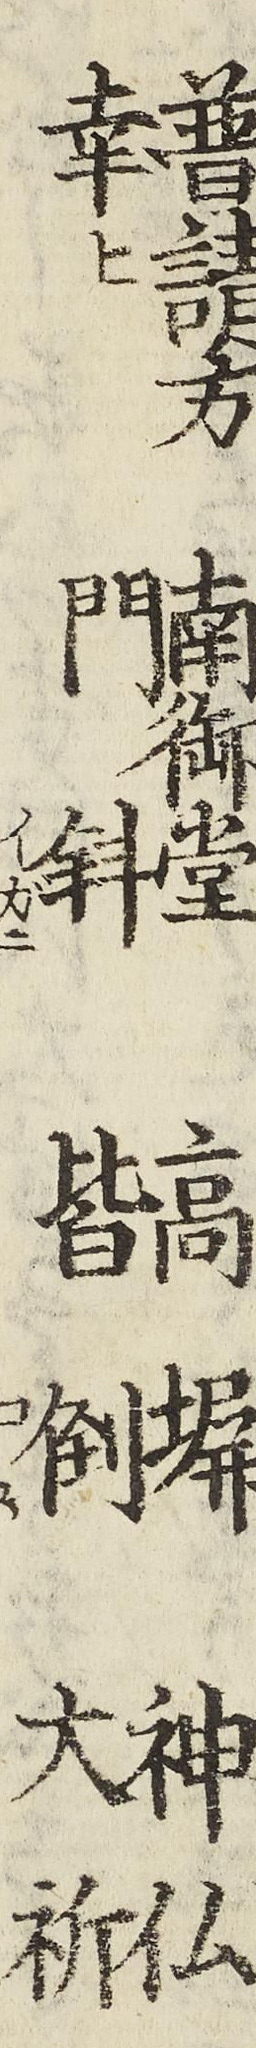幸ヒ門斜皆倒大祈
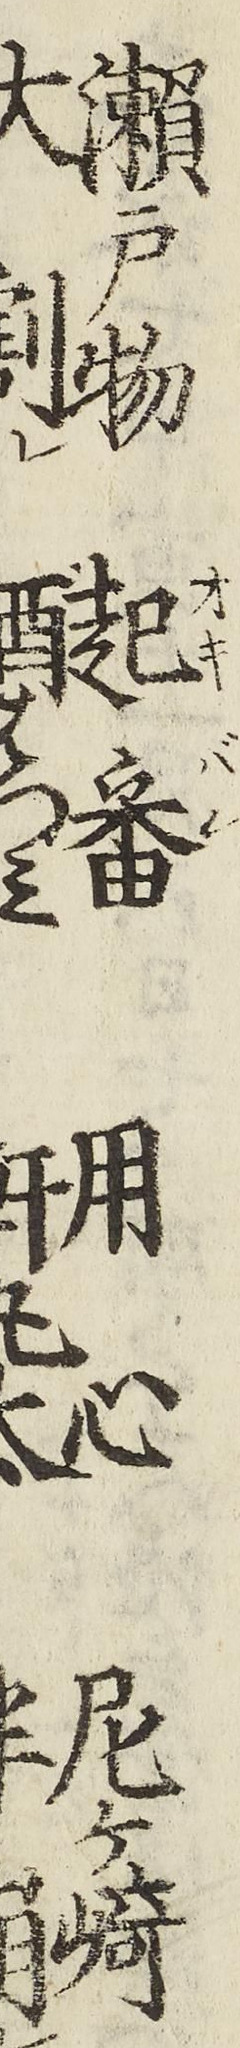瀬戸物起番用心尼ケ崎
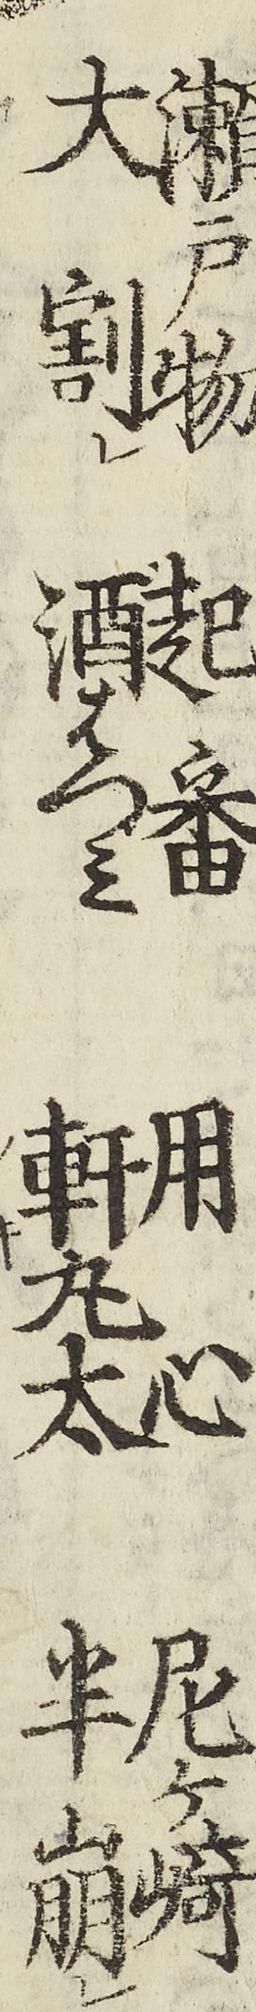大割レ酒はつみ軒丸太半崩レ
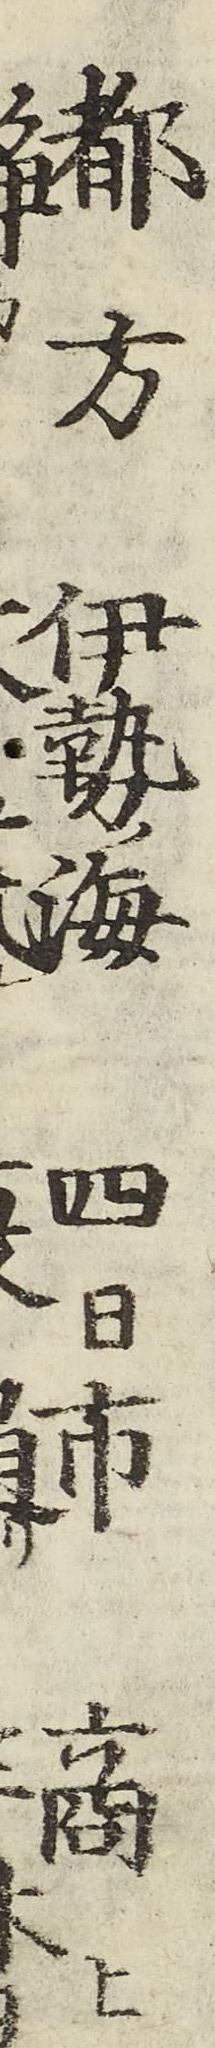都方伊勢海四日市商ヒ
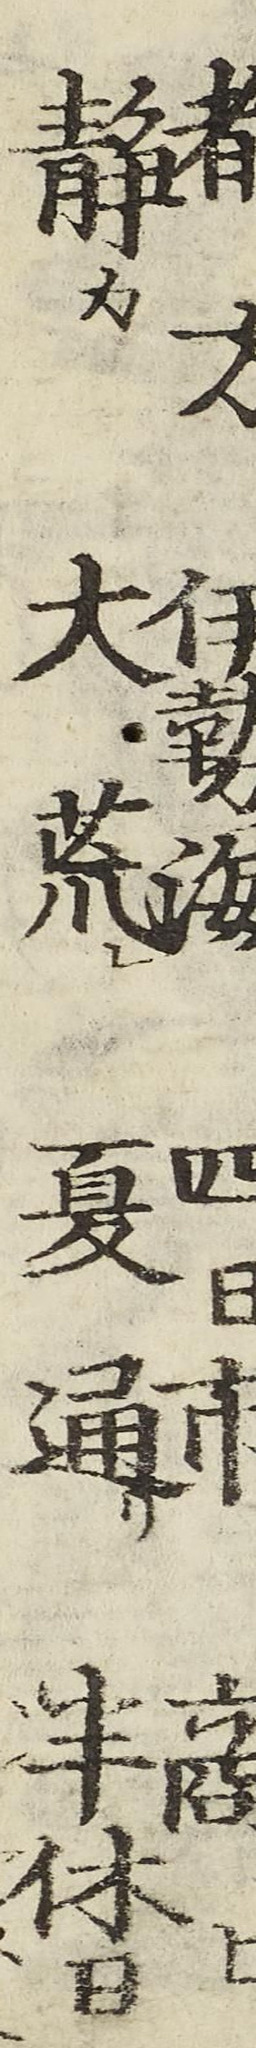静カ大荒レ夏通リ半休日

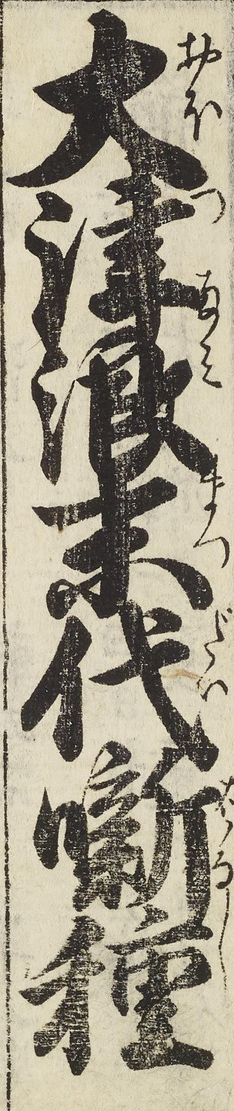大津浪末代噺種
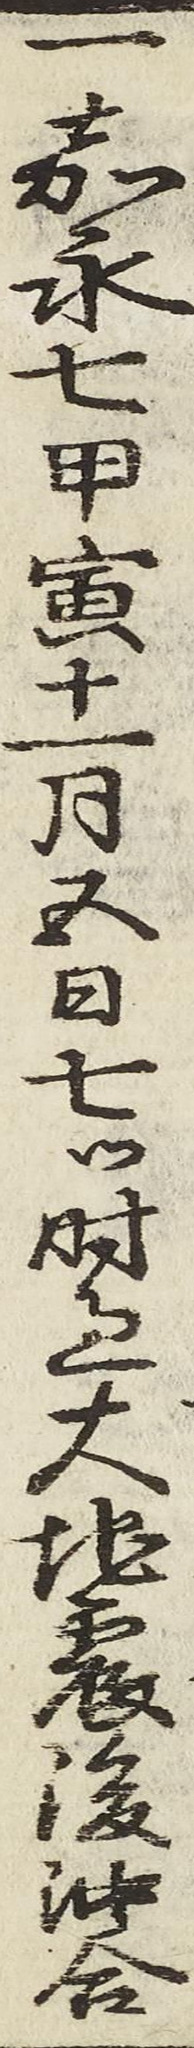一嘉永七甲寅十一月五日七ツ時過大地震後沖合
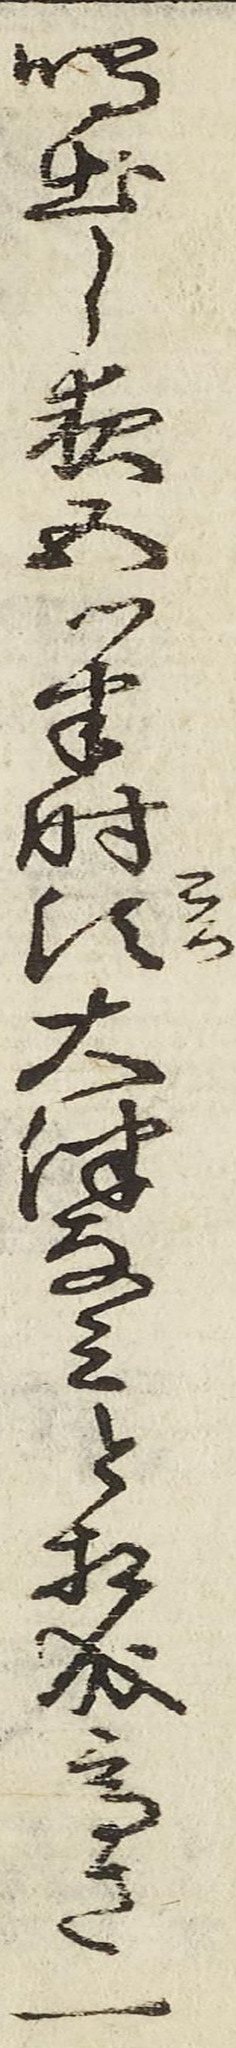鳴出し夜五ツ半時頃大津なみと相成高さ一
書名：地震津浪末代噺の種　全
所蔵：東京大学地震研究所図書室 Earthquake Research Institute Library, The University of Tokyo, JAPAN
